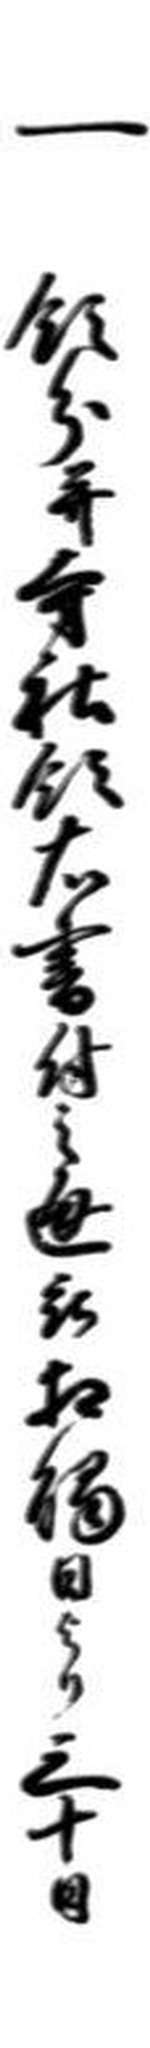一領分并寺社領右書付之通被相触日より三十日
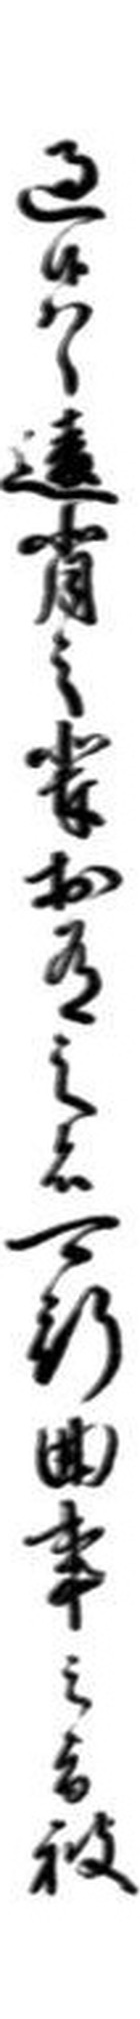過候ハヽ違背之輩於有之者可行曲事之旨被
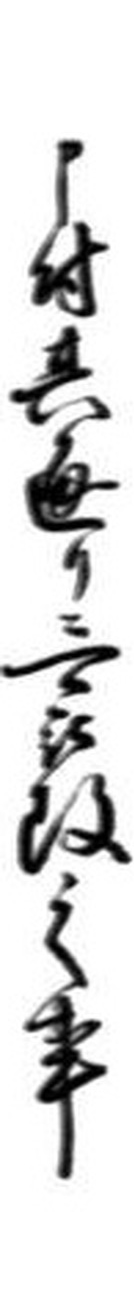申付其通りニ可被改之事

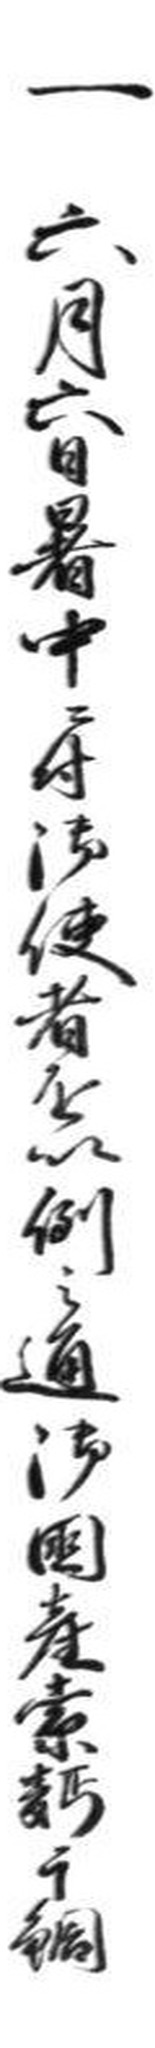一六月六日暑中ニ付御使者を以例之通御国産索麪干鯛
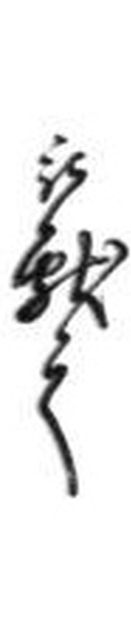被献之
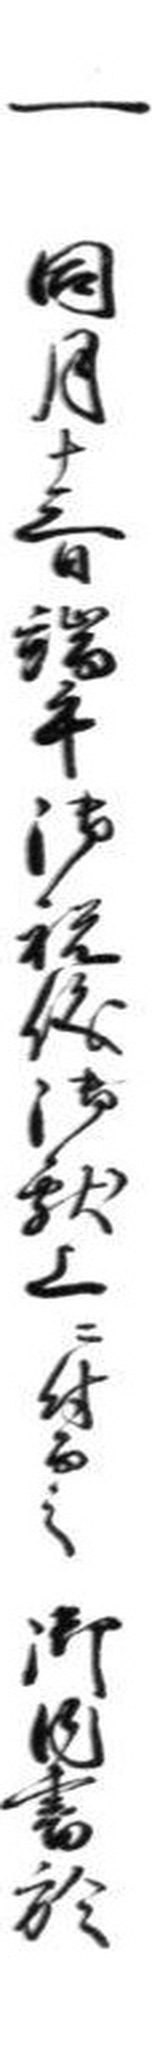一同月十三日端午御祝儀御献上ニ付而之御内書於
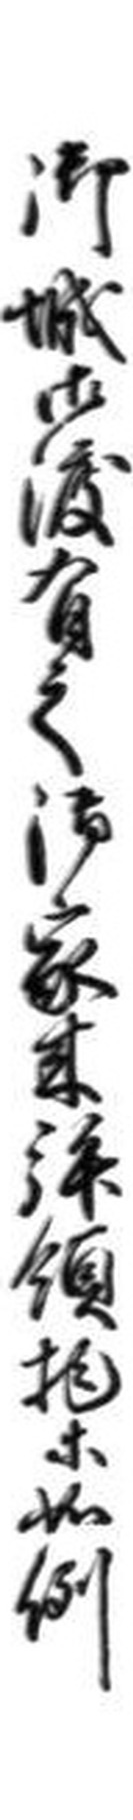御城御渡有之御家来拝領物等如例
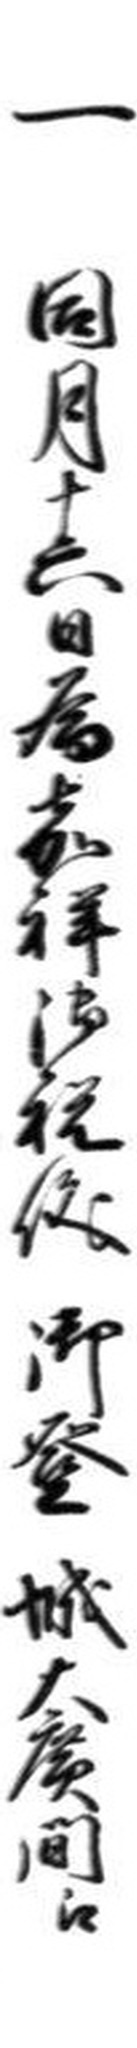一同月十六日為嘉祥御祝儀御登城大広間江
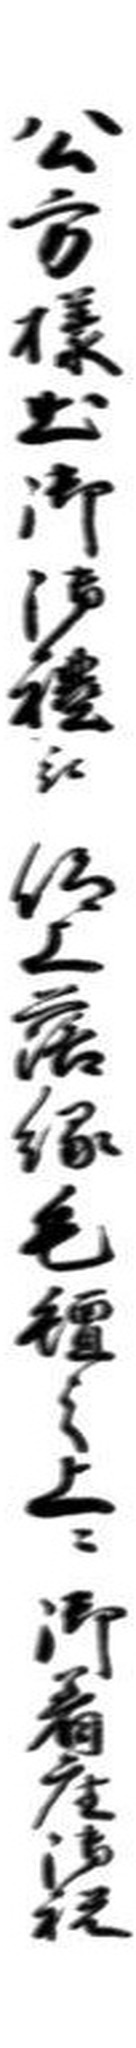公方様出御御礼被仰上落縁毛氊之上ニ御着座御祝
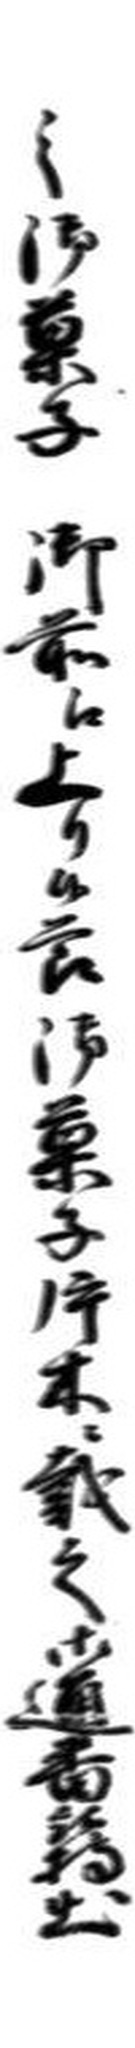之御菓子御前江上り候節御菓子片木ニ載之御通番被持出
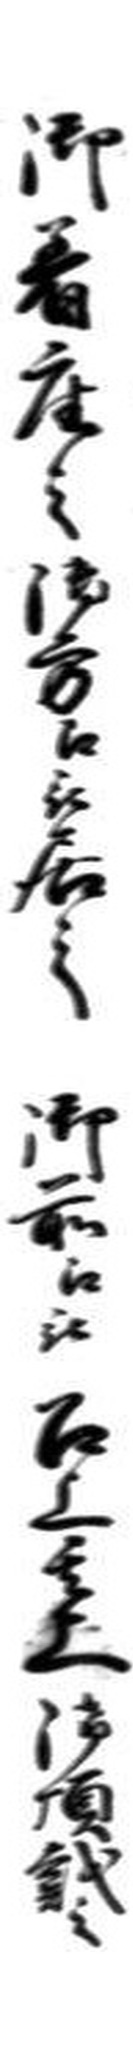御着座之御方江被居之御前江被召上其上御頂戴之
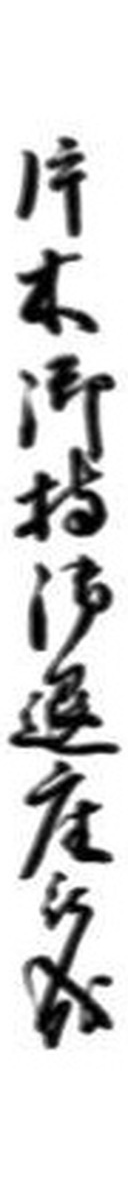片木御持御退座被成
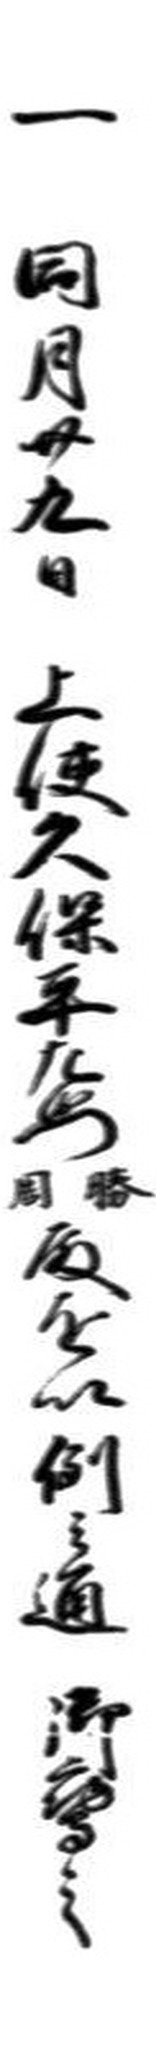一同月廿九日上使久保平左衛門勝周殿を以例之通御鷹之
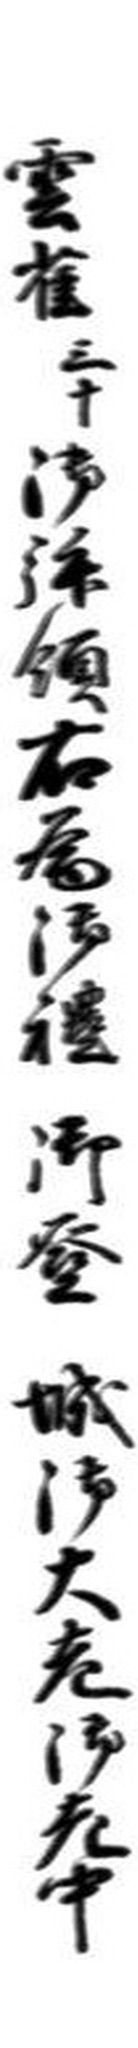雲雀三十御拝領右為御礼御登城御大老御老中
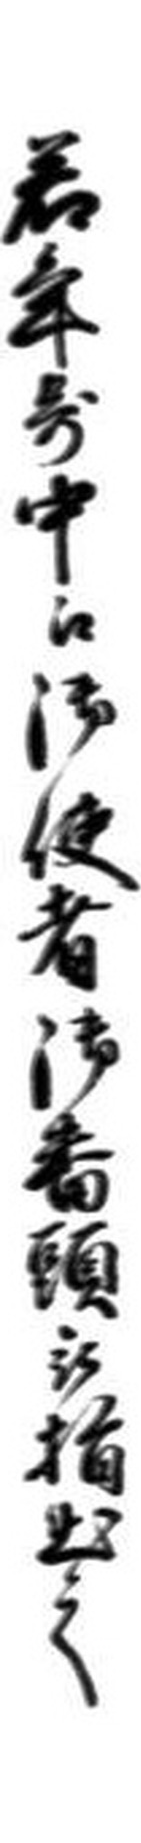若年寄中江御使者御番頭被指出之

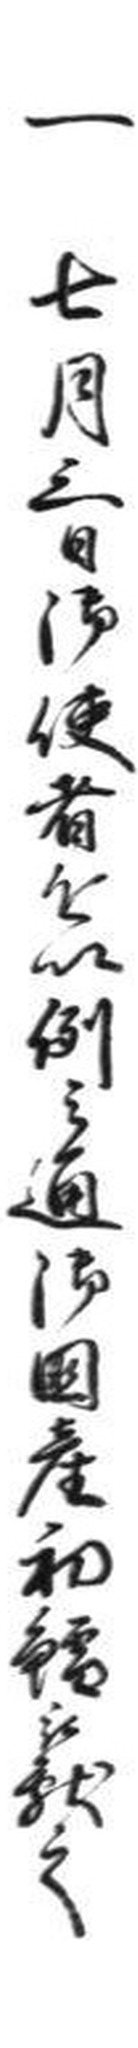一七月三日御使者を以例之通御国産初鱈被献之
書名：家譜 八 光通公 従寛文十年到同十二年
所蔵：福井県文書館 Fukui Prefectural Archives
